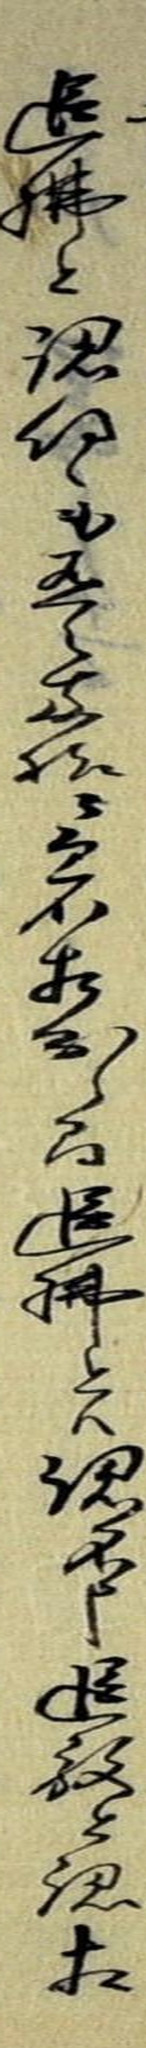追払と認伺候も有之両様に而不相分候間追払とは認不申追放と認相
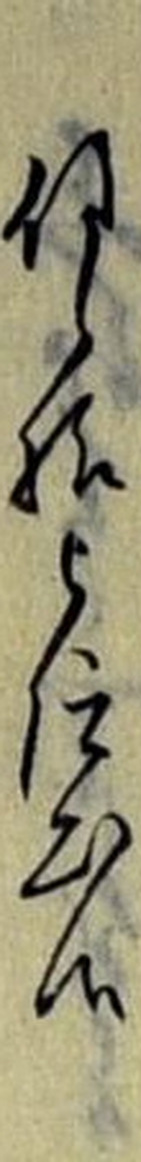伺候様被仰出候
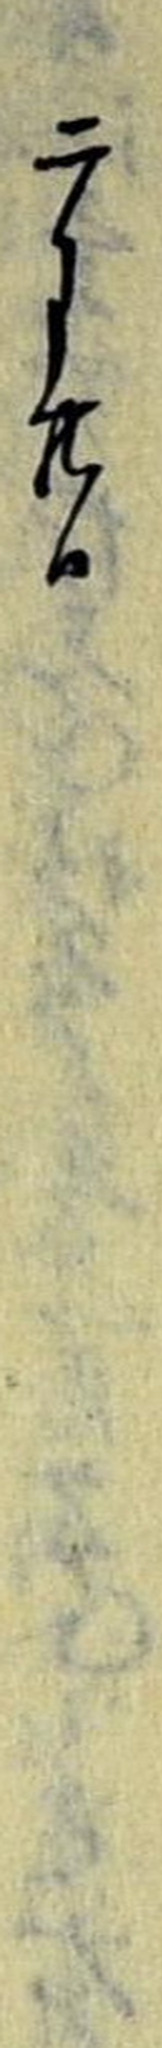二月廿日
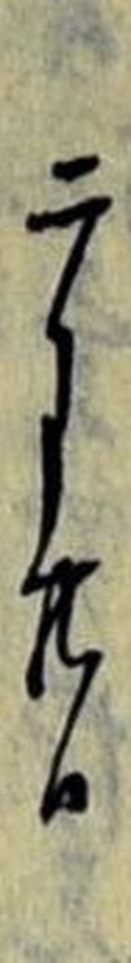二月廿日
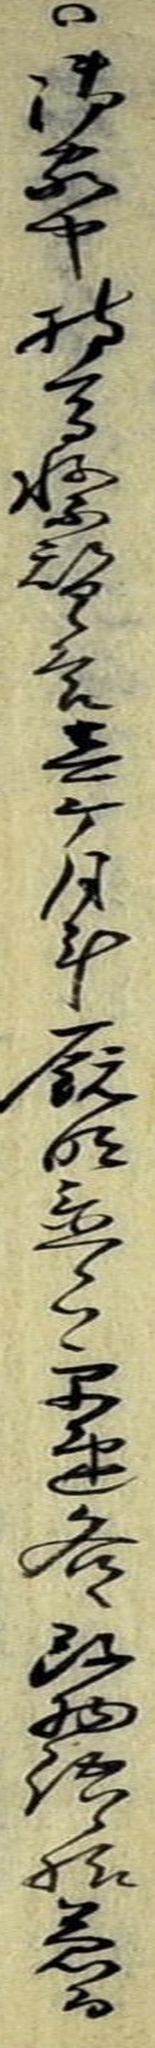〇御家中持馬替候節壱ヶ月斗厩明置候はゝ早速各へ致物語候様兼而
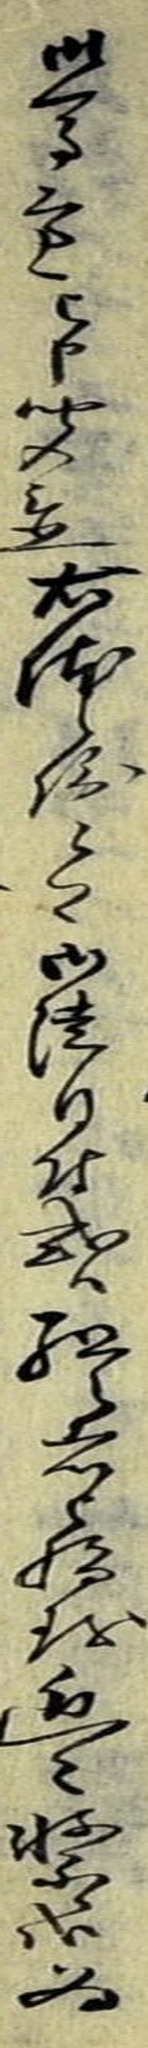御馬方へ被申聞置右体之儀候はゝ御徒目付或は組之者被指越近々候哉為
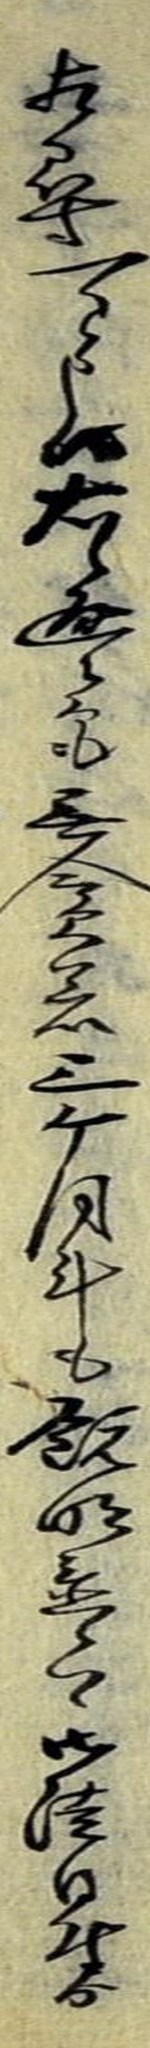相尋可被申候右之通に而も無貪着三ケ月斗も厩明置候はゝ御徒目付ゟ
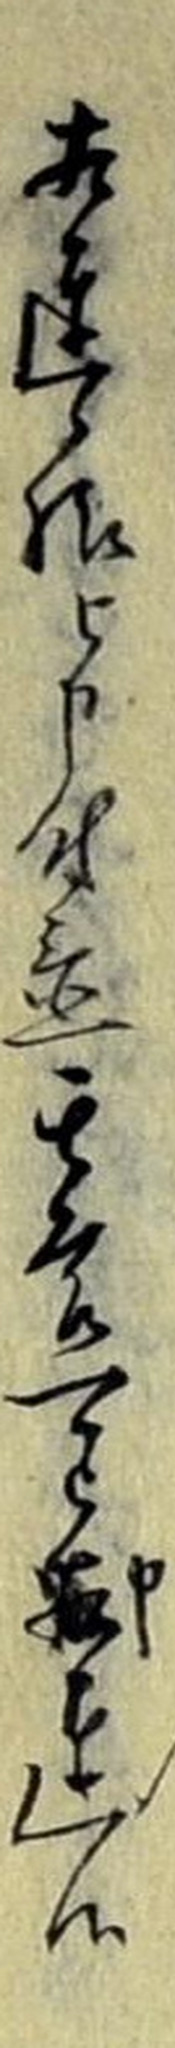相達候様被申付置其節可被申達候
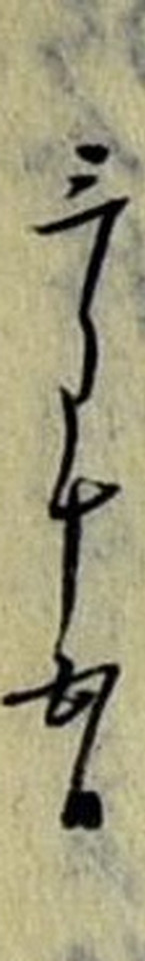三月十五日

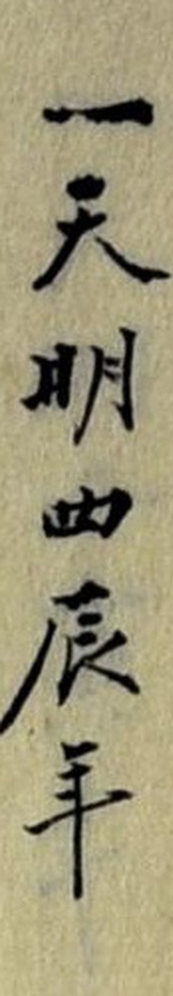天明四辰年
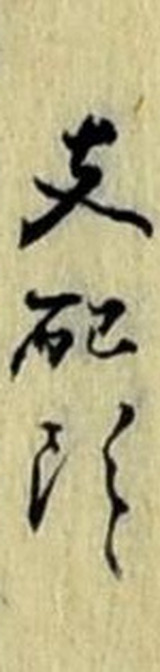支配頭へ
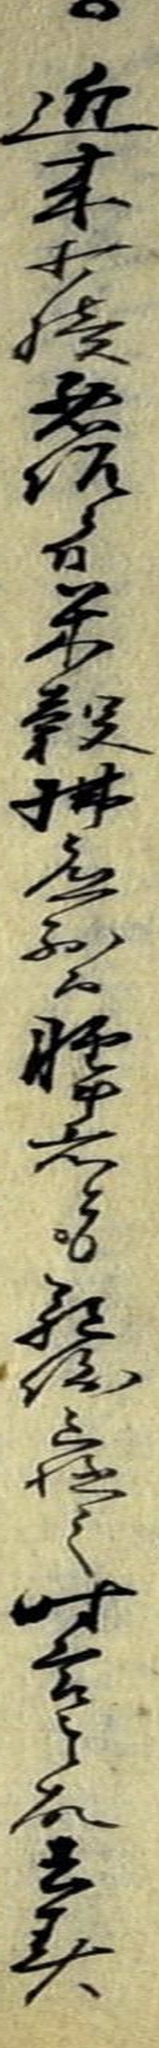〇近来打続悪作に付米穀払底別而軽き者とも難儀至極之時節に候故去春
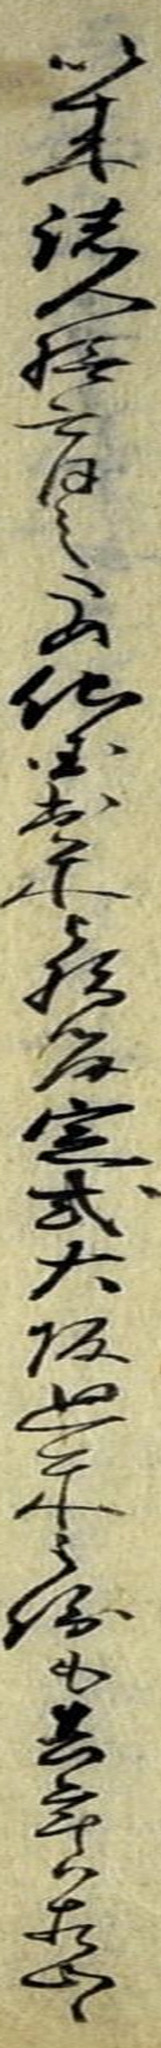以来諸人育之ため他国出米被指留定式大坂廻米之儀も去年は相止候
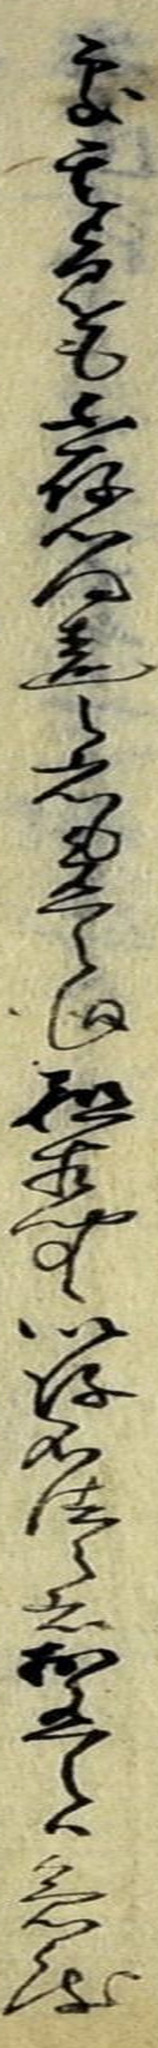処其旨をも不存心得違之者も有之趣相聞候以後不法之者於有之は急度
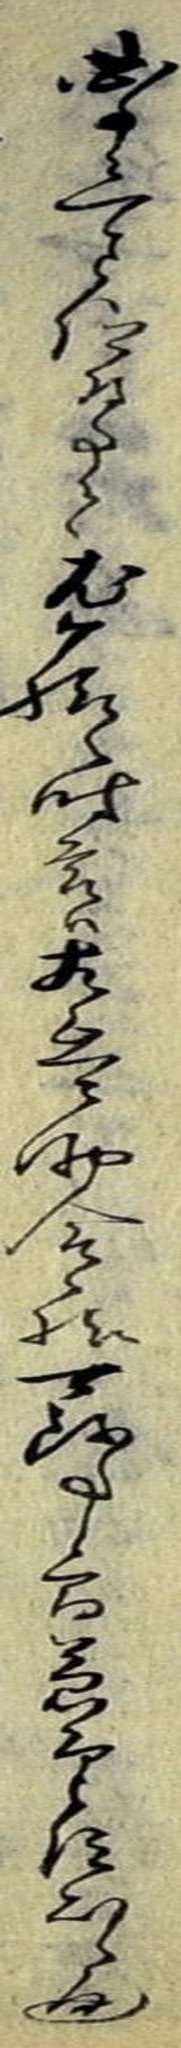曲事に可被仰付事に候尤ケ様之時節は相互に助合候様可致事候間兼而被仰出候通
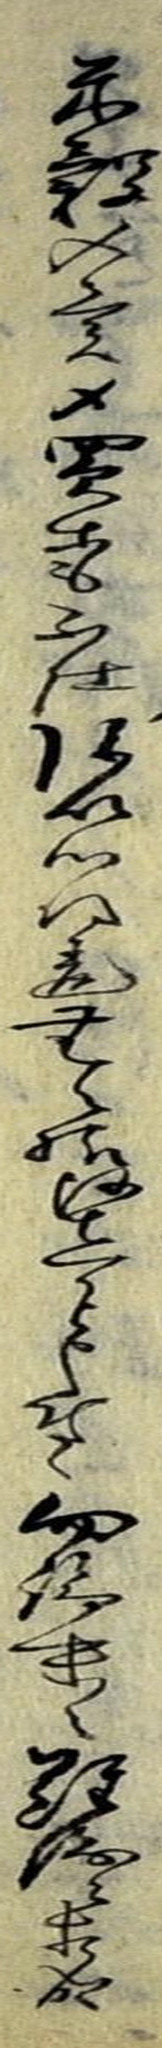米穀〆売〆買等も不仕弥以心得違無之様堅可被申付候勿論末々難儀に相成候
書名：命令之部 二
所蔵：福井県文書館 Fukui Prefectural Archives
